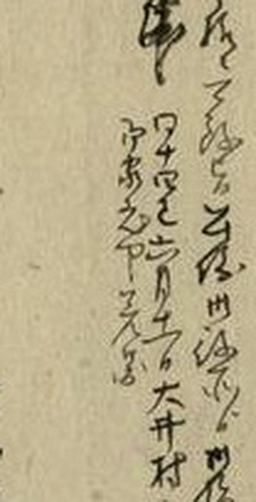御家老中差図
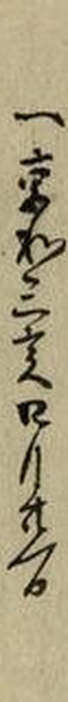一享和三亥四月廿一日
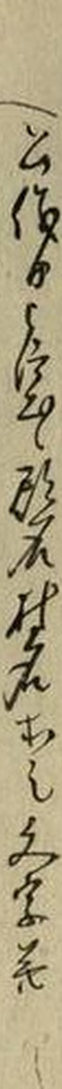公儀ゟ被仰出候郡名村名等之文字幷
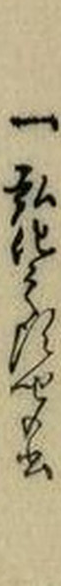一弘化之頃聞書
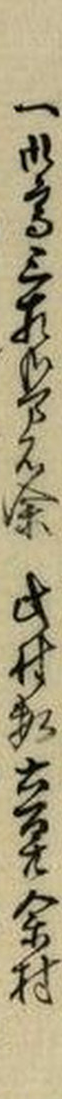一御高三拾弐万石余此村数六百廿余村
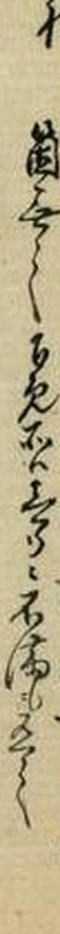箇無之下免所ハ壱ツニ不満も有之
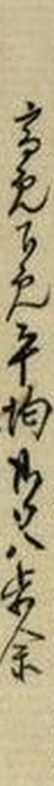高免下免平均弐ツ八歩余
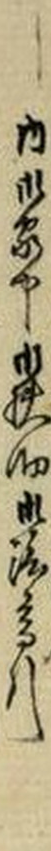内御家中御扶助御渡高引
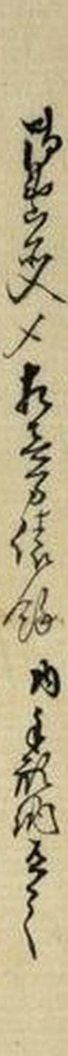御台所入〆拾壱万俵余内手形納有之

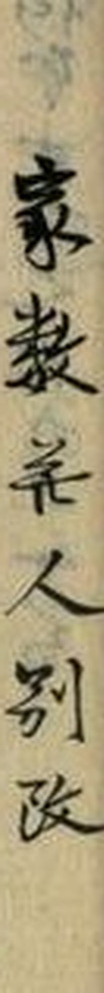家数幷人別改
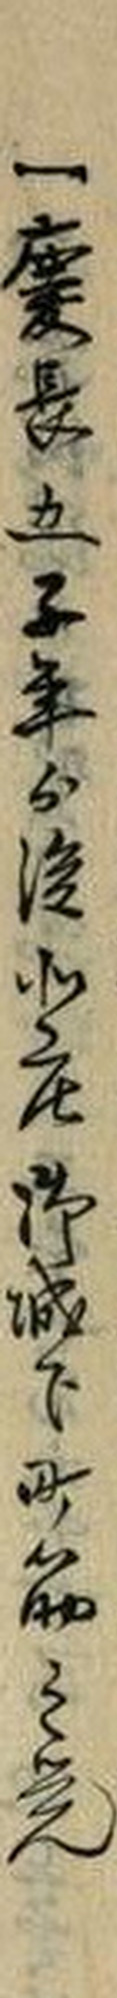一慶長五子年ゟ後北庄御城下町筋之覚
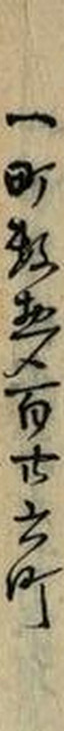一町数惣〆百廿六町
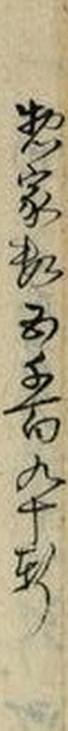惣家数五千百九十軒
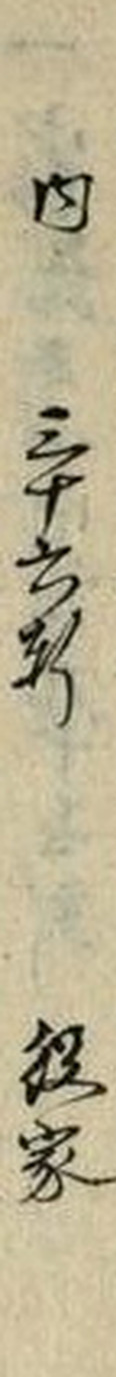内三十六軒役家
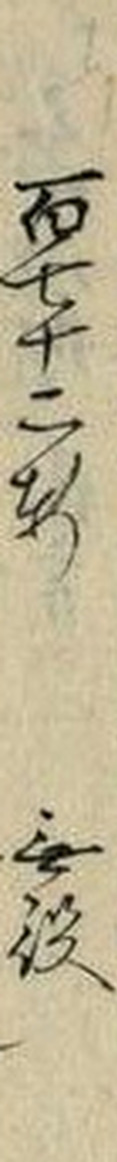百七十二軒無役
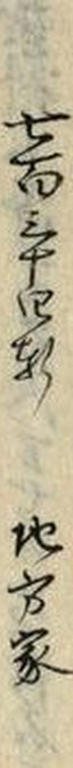七百三十四軒地方家
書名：御国他国諸事之部
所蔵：福井県文書館 Fukui Prefectural Archives
